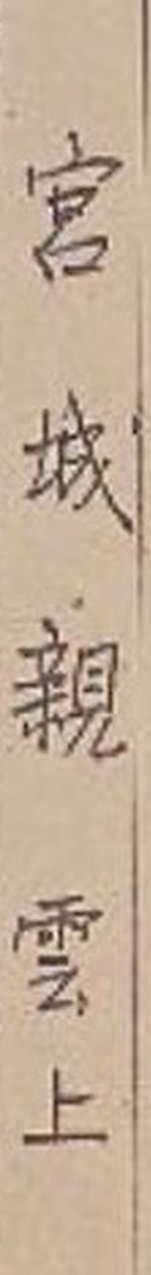宮城親雲上
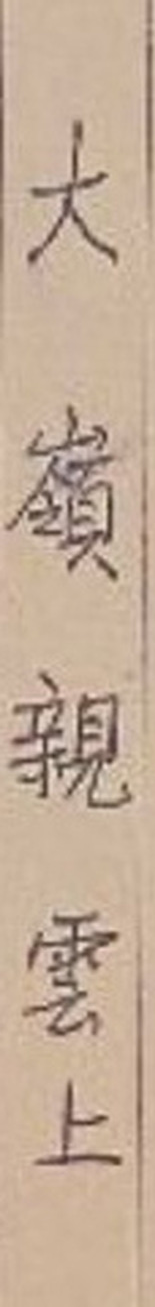大嶺親雲上
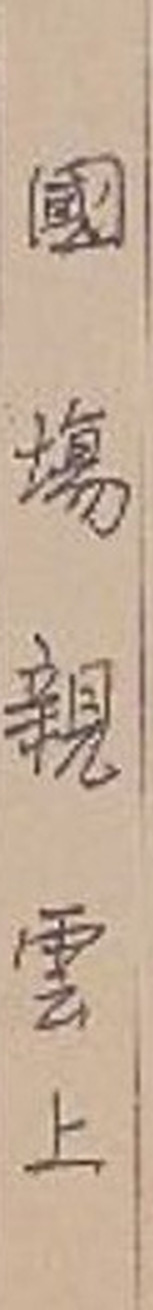国場親雲上
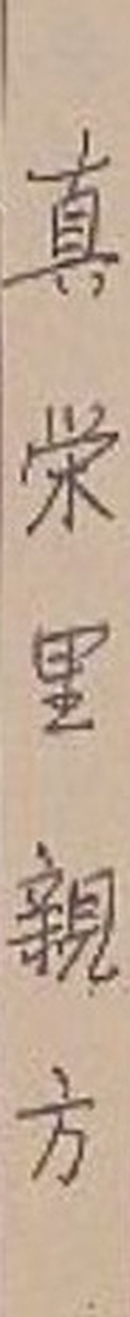真栄里親方

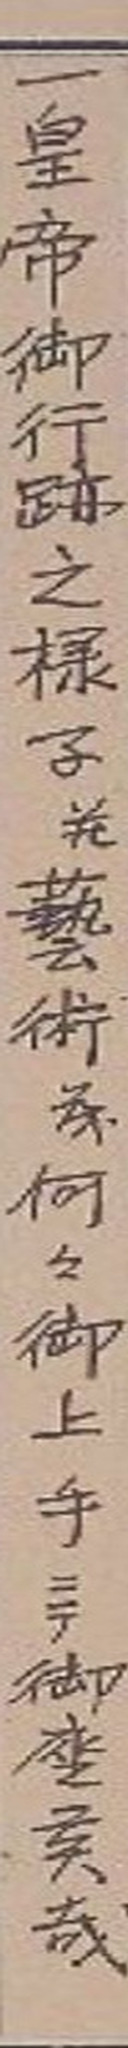一皇帝御行跡之様子并芸術も何々御上手にて御座候哉
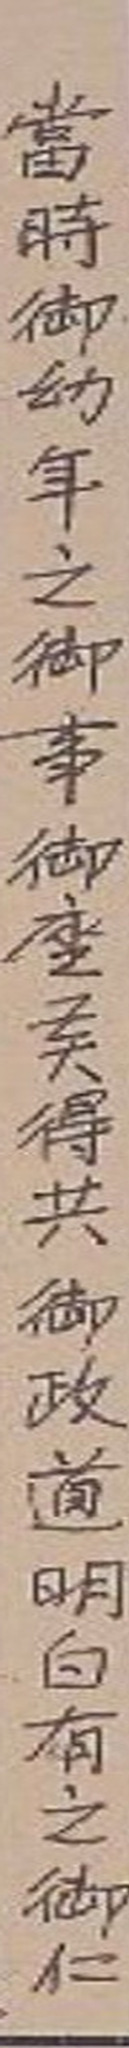当時御幼年之御事御座候得共御政道明白有之御仁
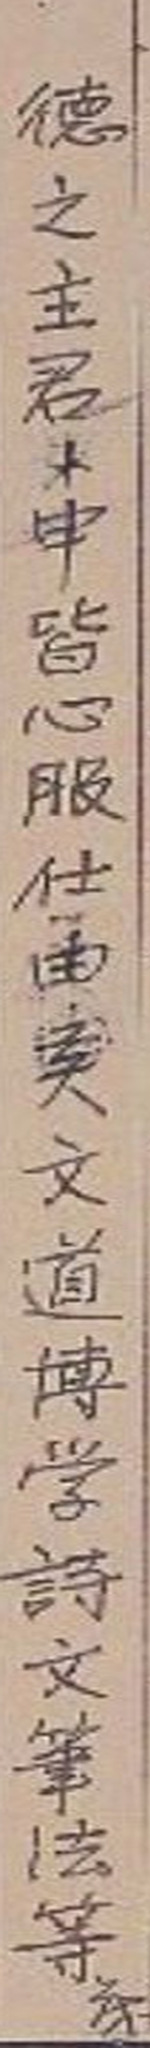徳之主君と申皆心服仕由候文通博学詩文筆法等も
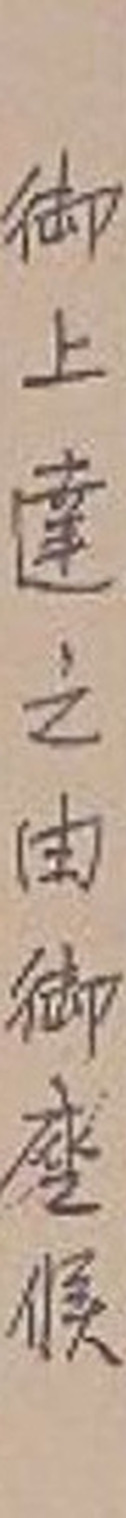御上達之由御座候
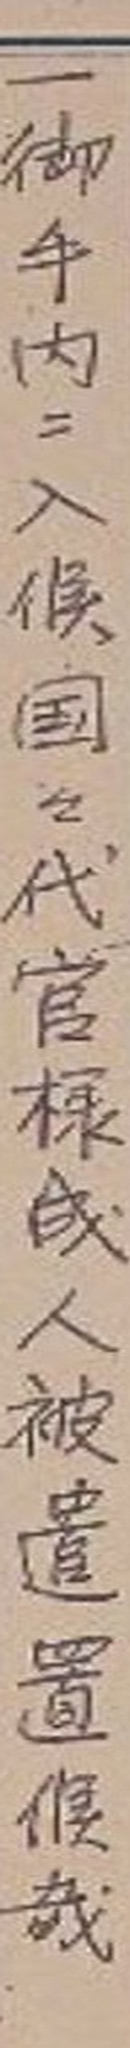一御手内に入候国々代官様成人被遣置候哉
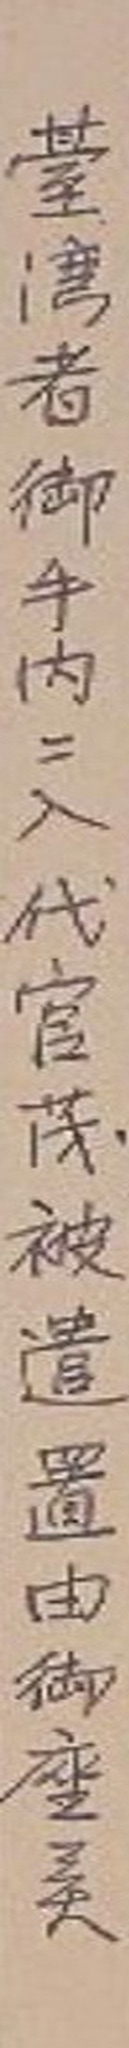台湾は御手内に入代官も被遣置由御座候
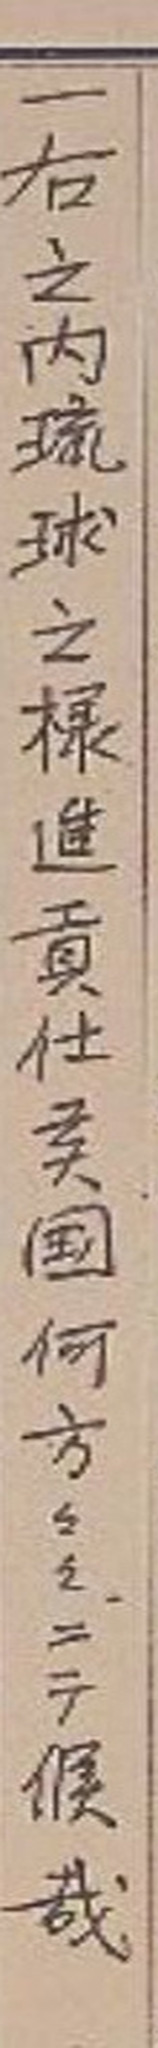一右之内琉球之様進貢仕候国何方々々にて候哉
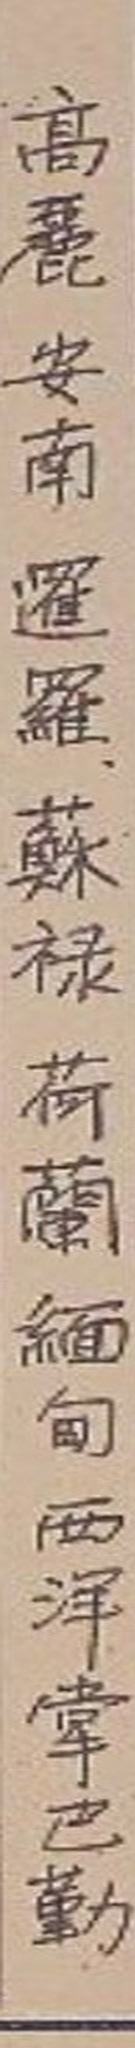高麗安南暹羅蘇禄荷蘭緬甸西洋掌巴勤
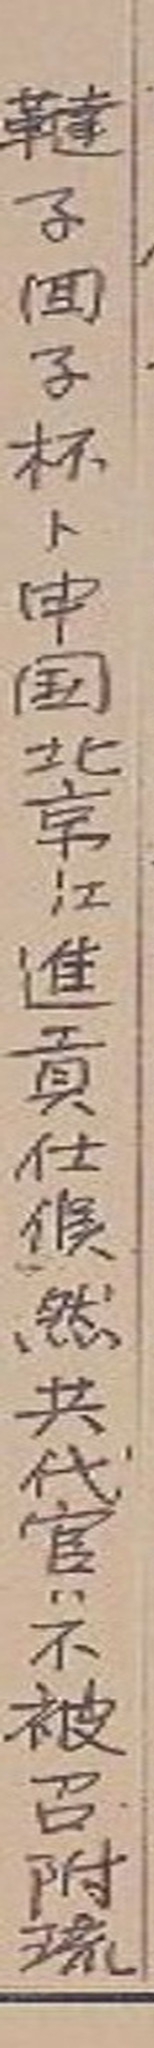韃子回子抔と申国北京え進貢仕候然共代官は不被召附琉
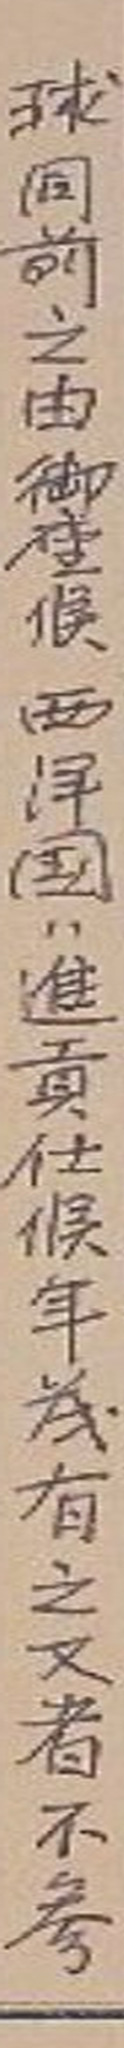球同前之由御座候西洋国は進貢仕候年も有之又は不参
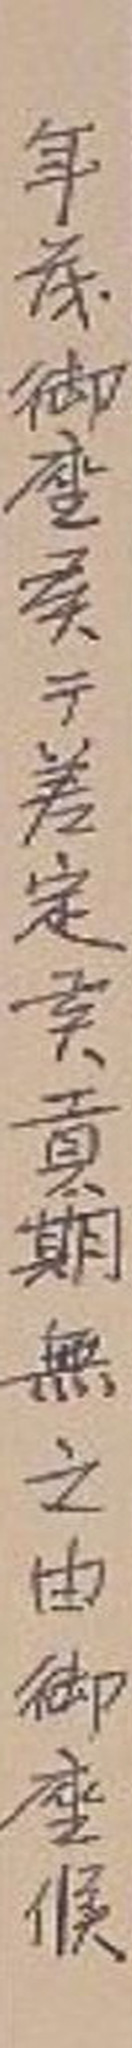年も御座候て差定候貢期無之由御座候
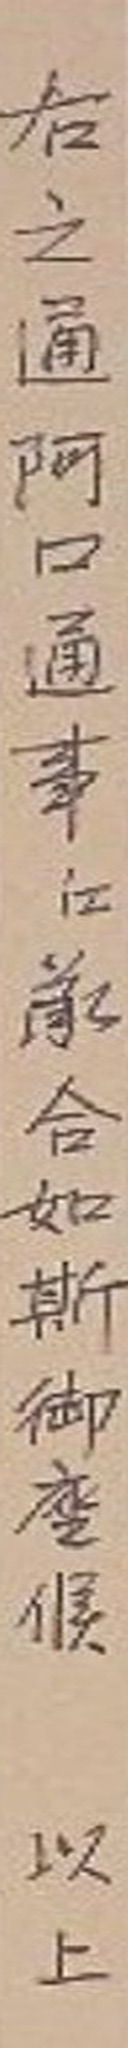右之通阿口通事え承合如斯御座候以上
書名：支那冊封使来琉諸記 下巻
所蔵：University of the Ryukyus Library
